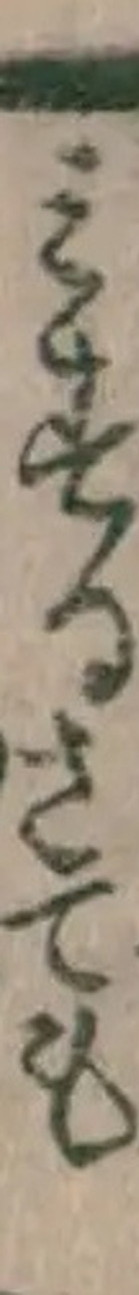みするさても
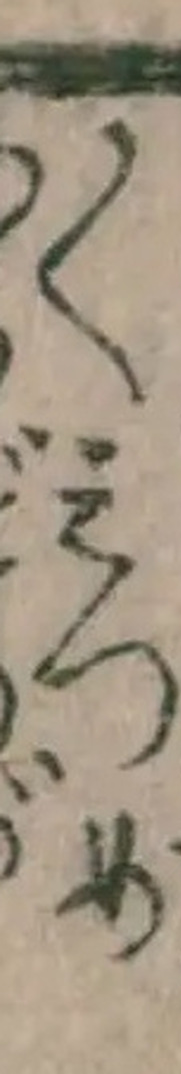〳〵みつめ
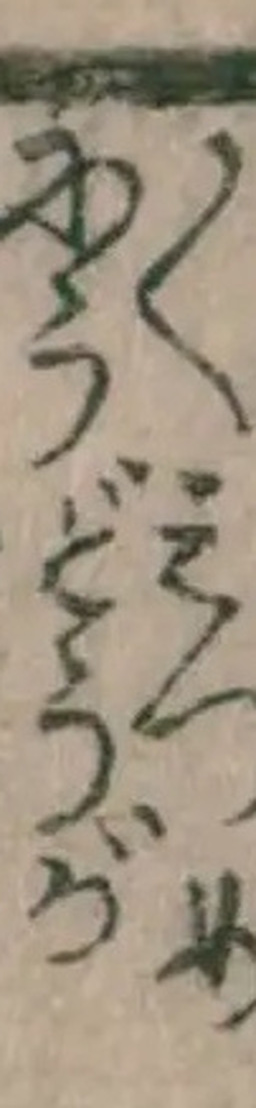にうどうが
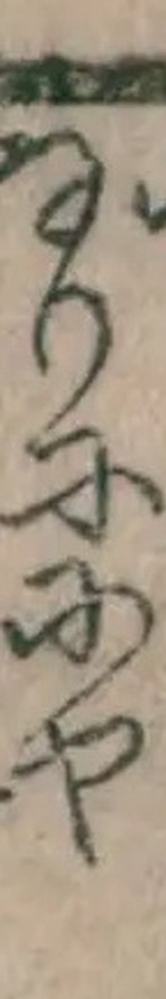なりににや
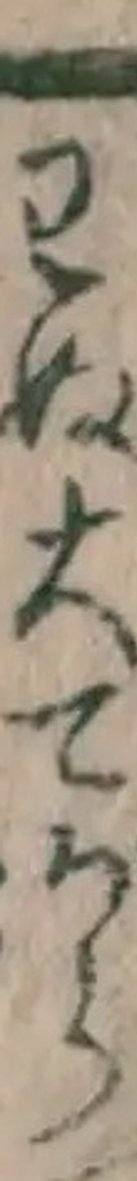わぬ大てがら
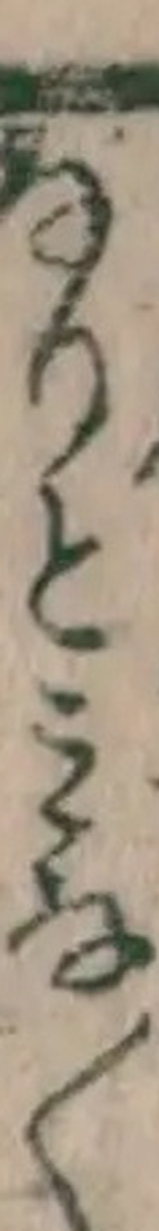なりとみな〳〵
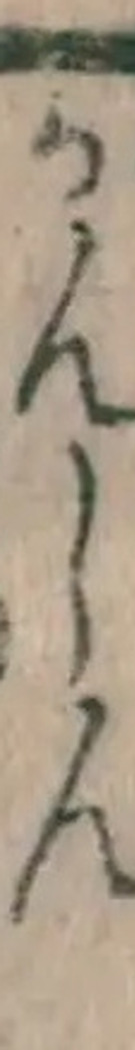かんしん
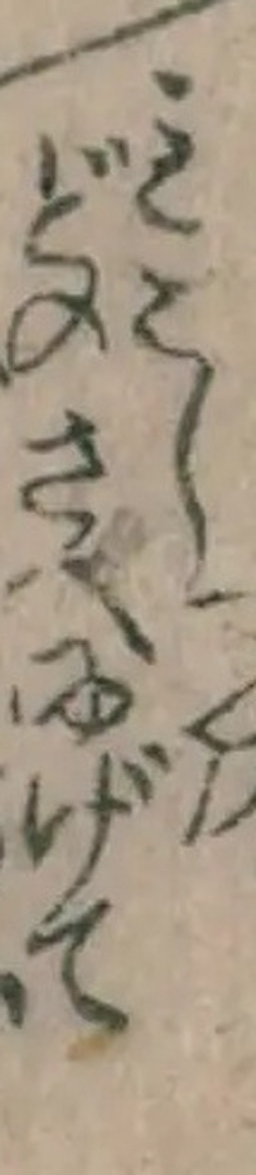どのさへにげて
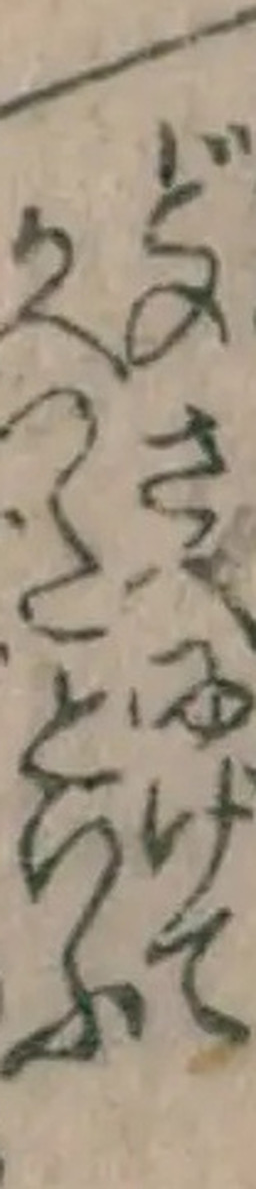かへつたといふ
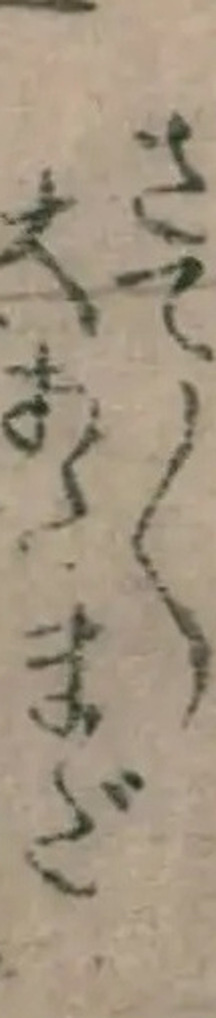大あたまだ
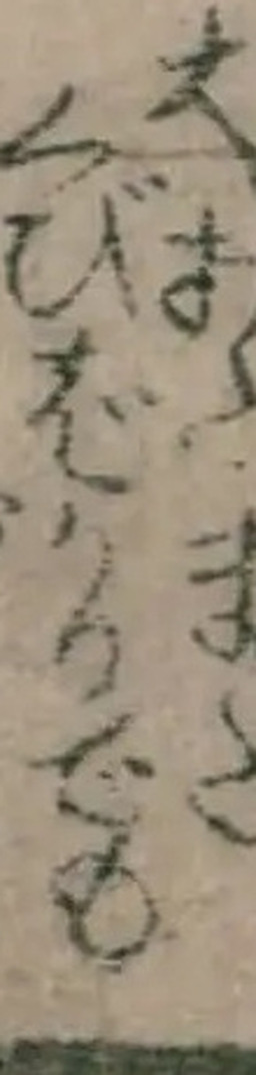くびばかりでも
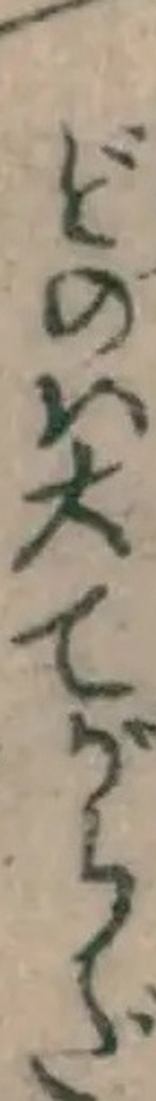どのは大てがらだ
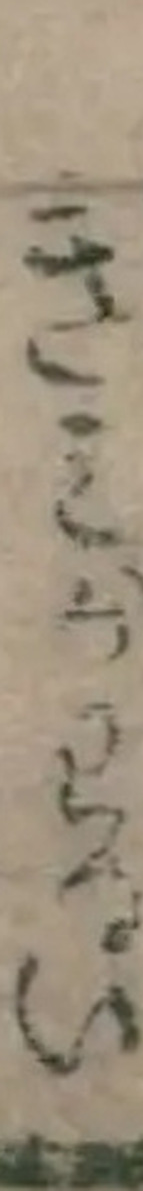きみがわるい

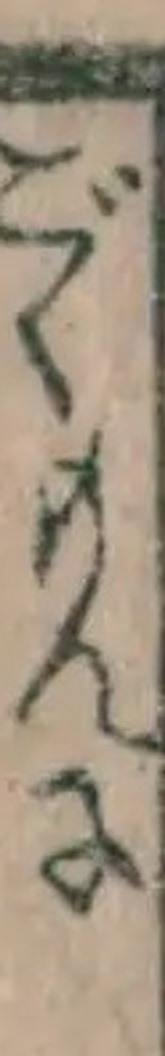ごくもんに
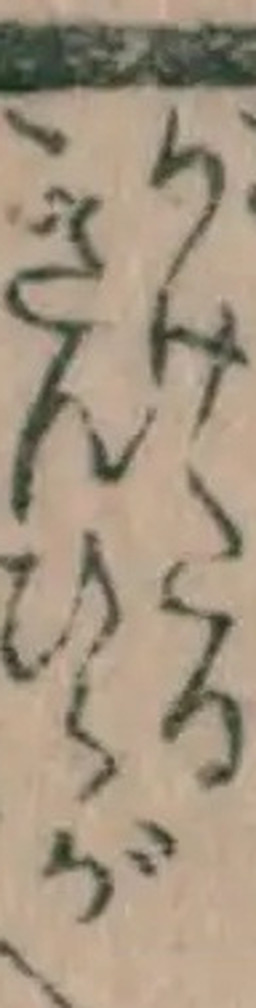きにひらが
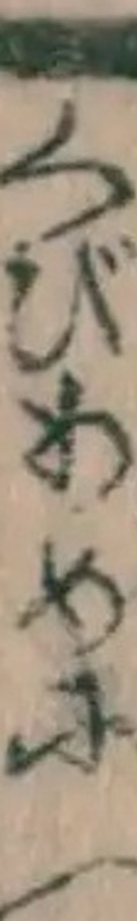くびあめに
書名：信有奇怪会
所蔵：国立国会図書館 National Diet Library, JAPAN
